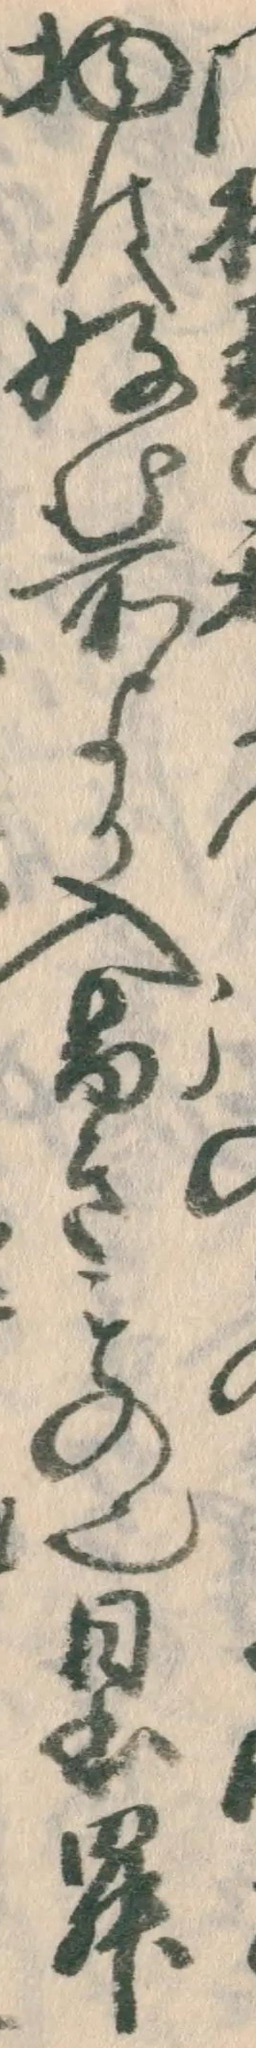物は好む所より入易きもの也日本曻
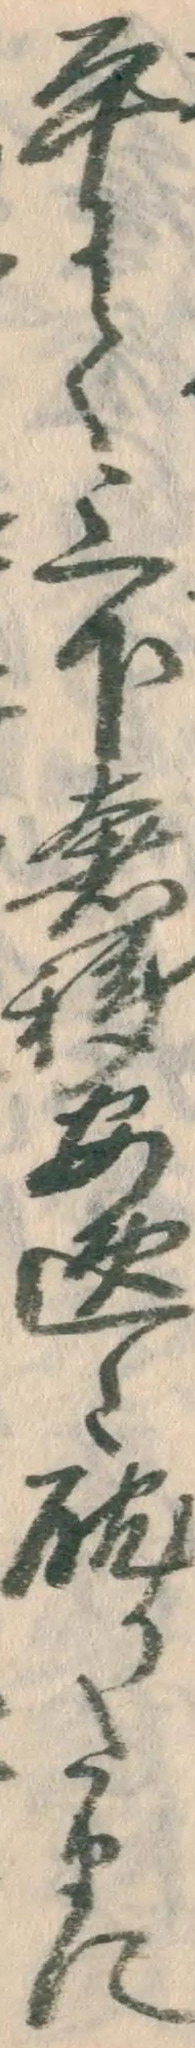平にて上下奢侈安逸ニ耽りたまに
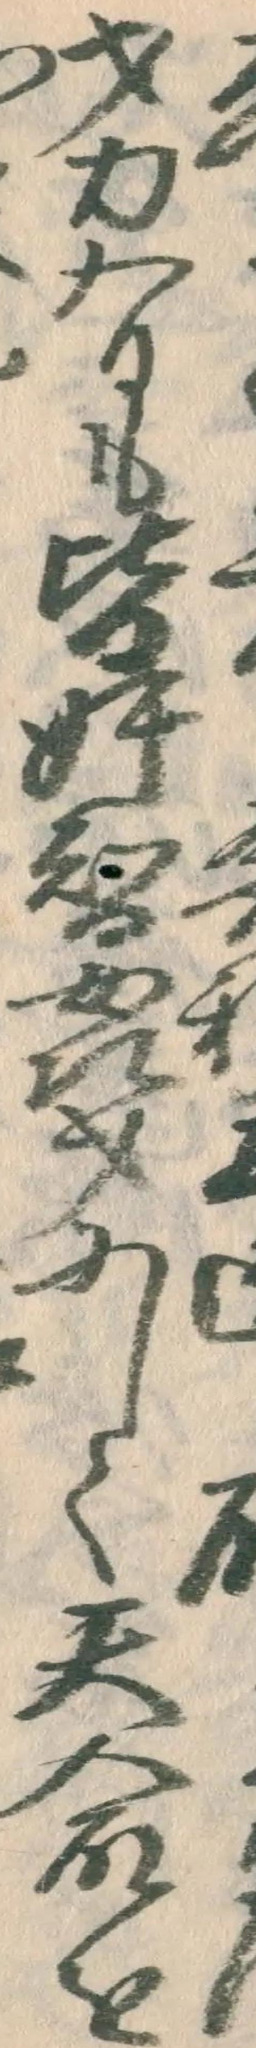才力有も皆奸智姦才にして天命を
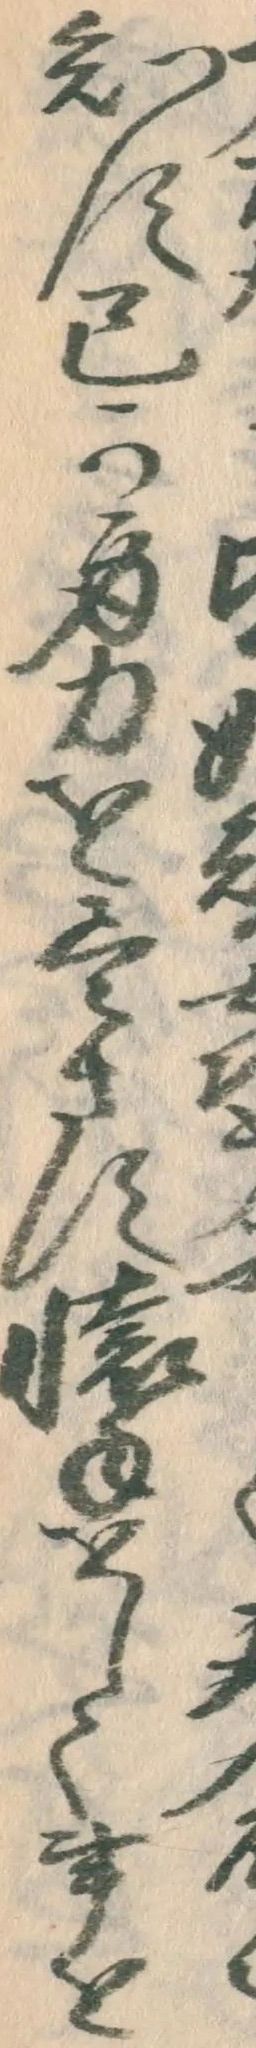知す己か身力を尽さす懐手をして事を

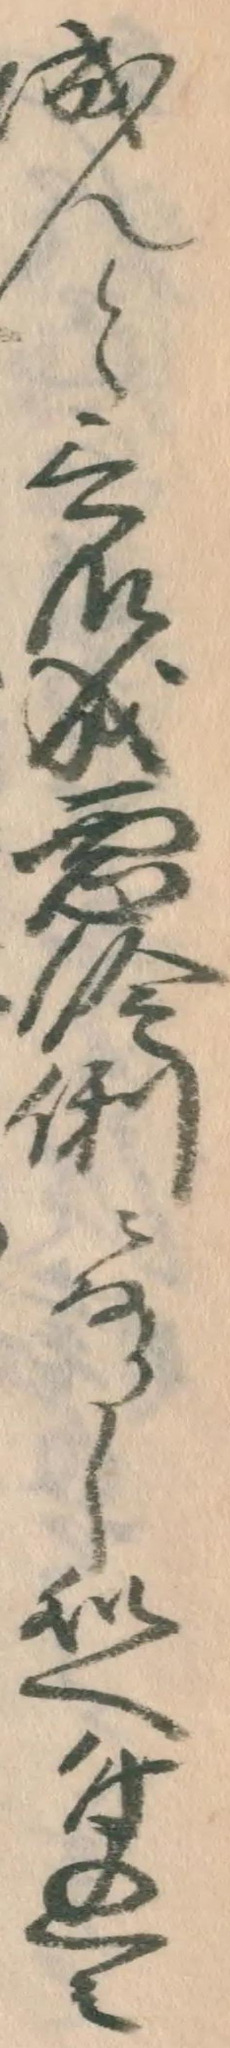成んと云様成悪怜悧ニなりし処へ付込ミ
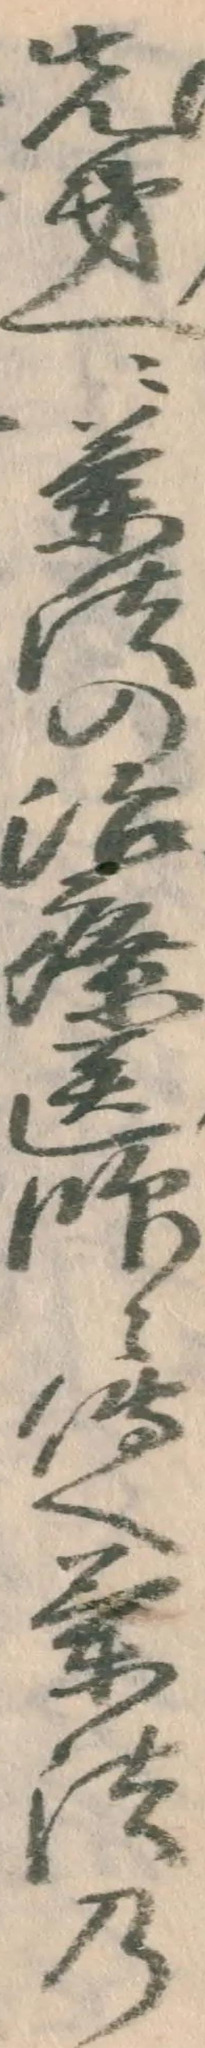先第一ニ蘭法の治療医師ニ傳へ蘭法の
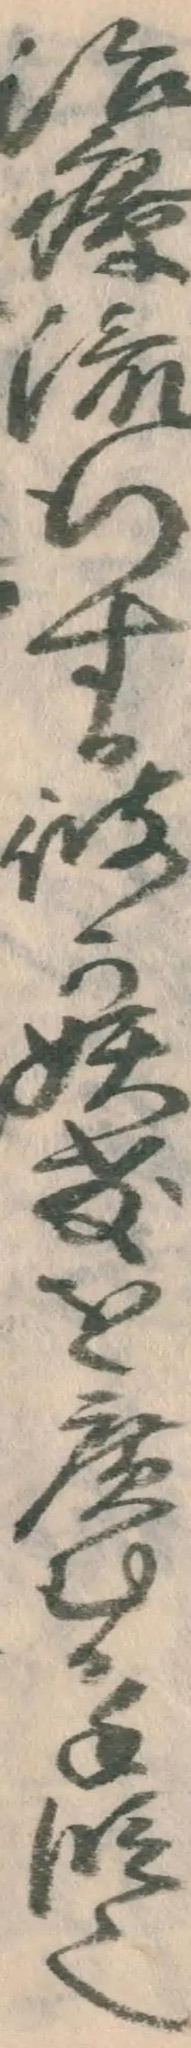治療流行する彼か妖教を廣むる手段也
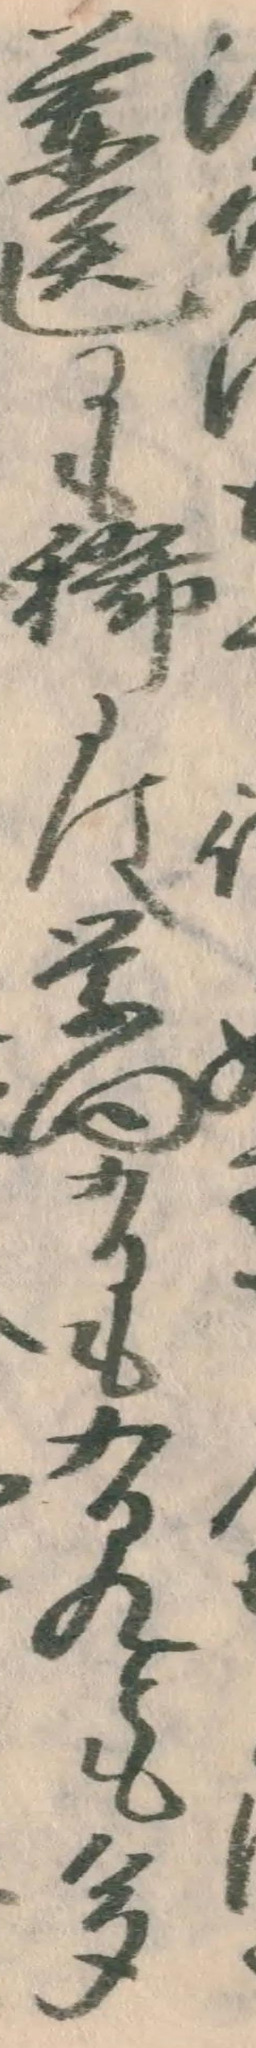蘭医にも稀には学問有も有れとも多
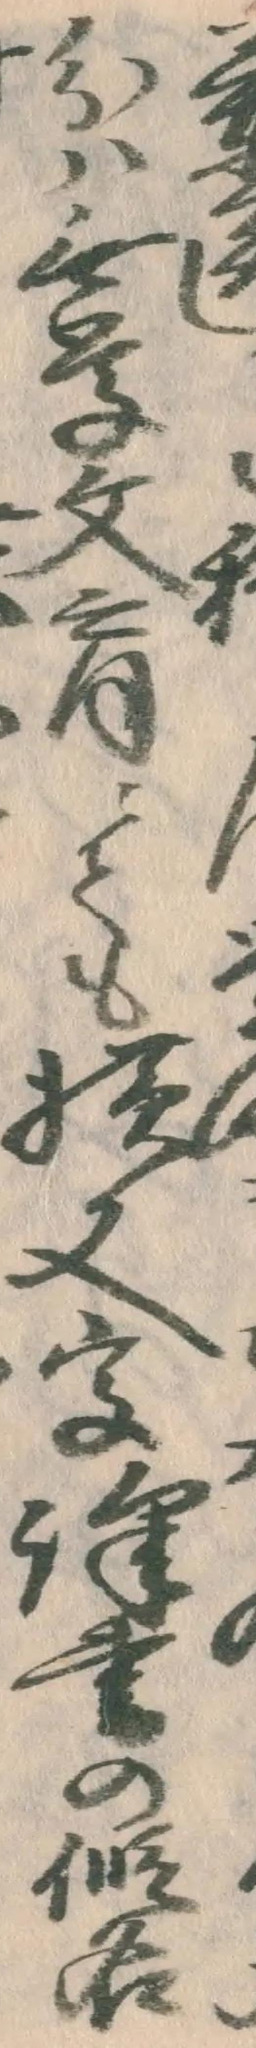分ハ無学文盲ニても横文字譯書の假名
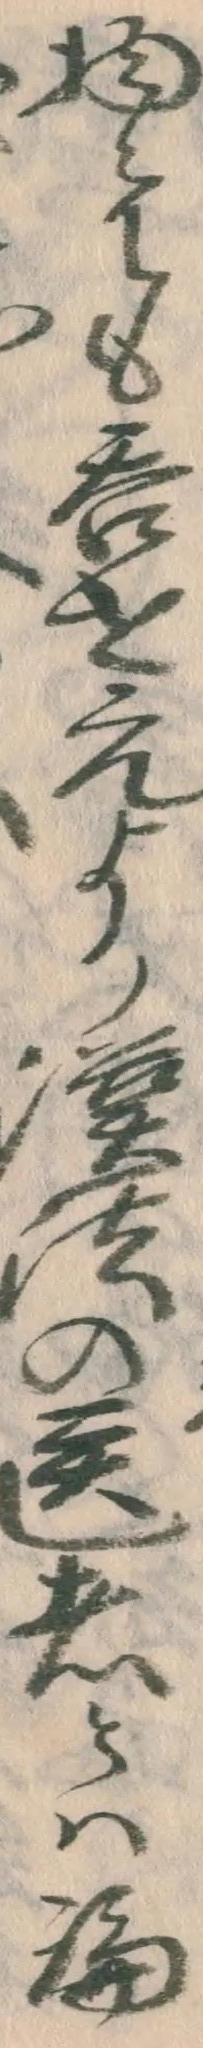物ニても呑せ元より漢法の医者とハ論
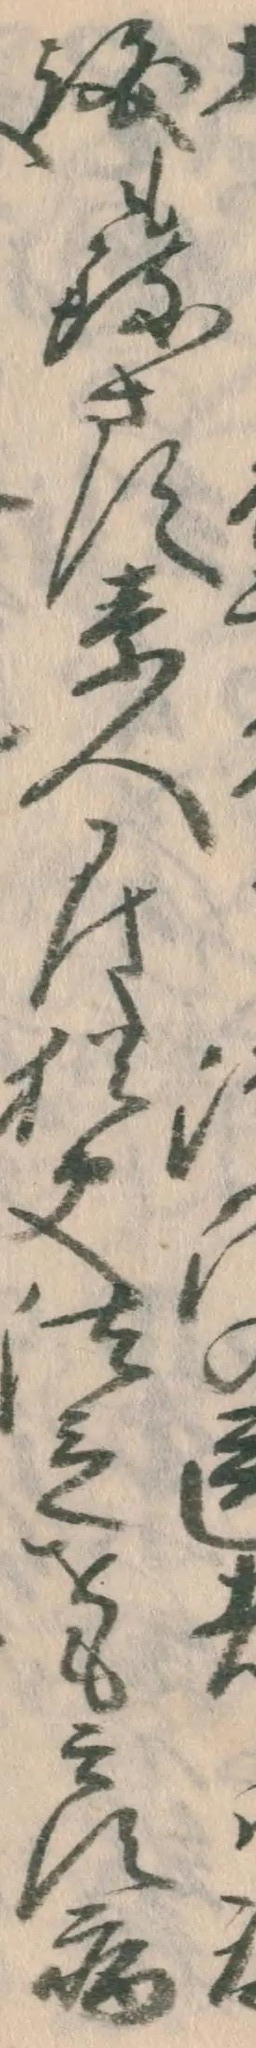議も致さす素人には猶更法意をも云す病
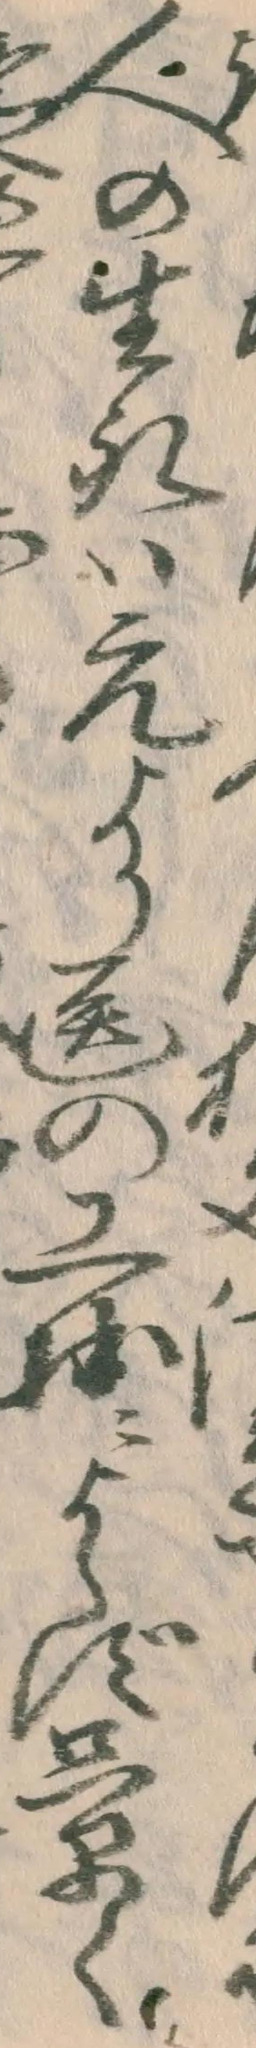人の生死ハ元より医の工拙ニよらず只早く
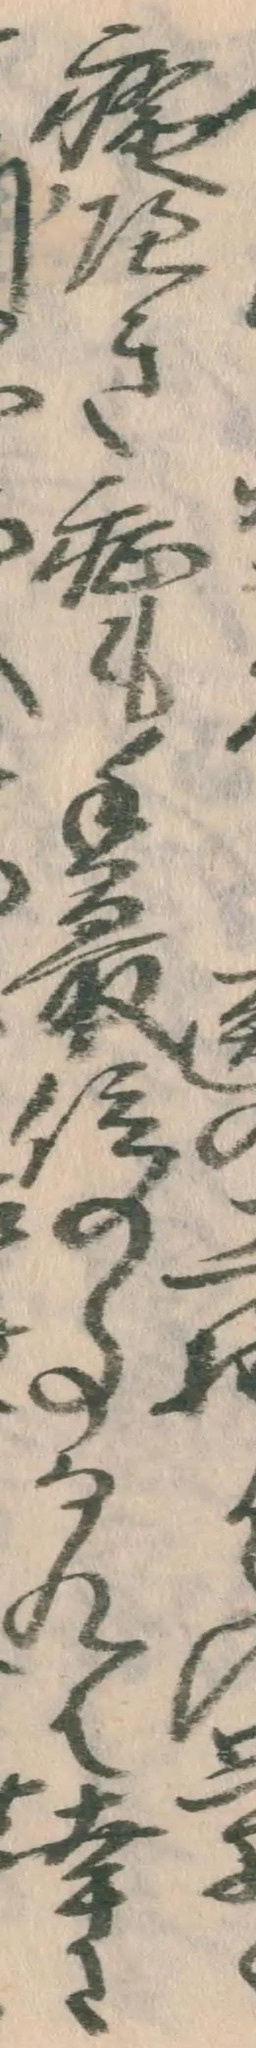癒へき症も手間取位の事なれは幸に
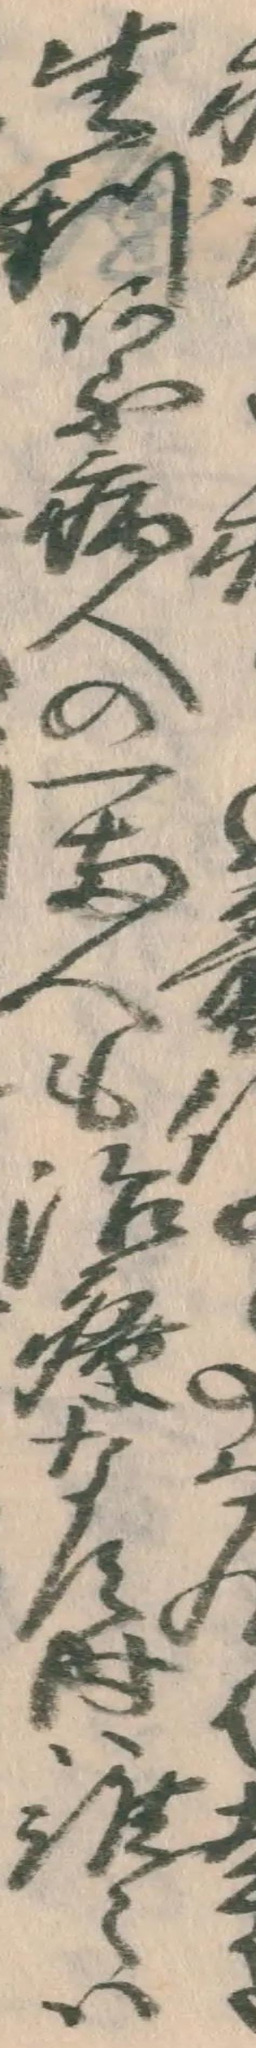生利ある病人の一両人も治療なす時ハ誰々ハ
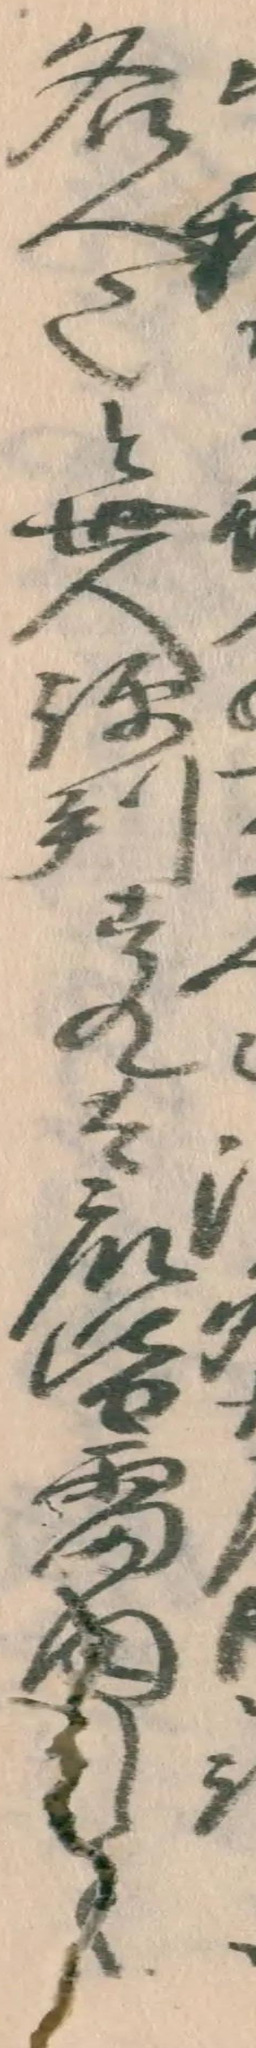名人也と世人評判すれは衆皆雷同して
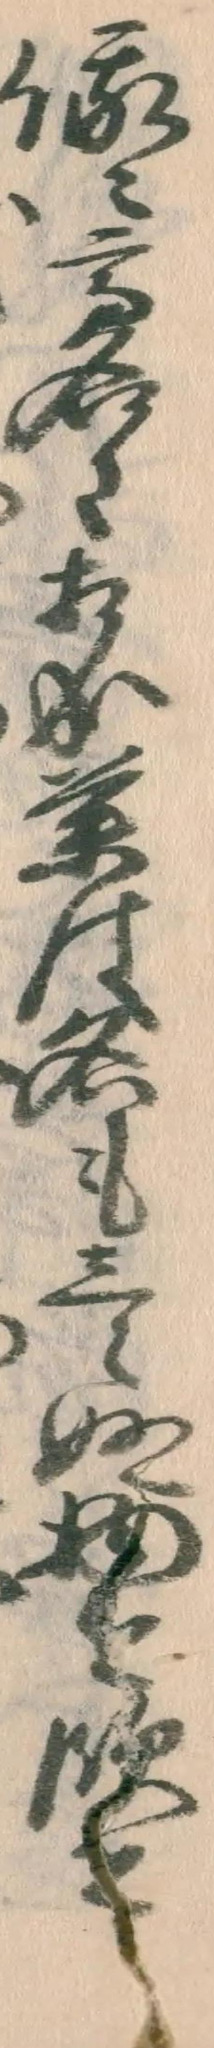俄ニ高名ニ相成薬は名もしらぬ物を飲せ
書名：麗斎叢書. 20
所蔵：国立国会図書館 National Diet Library, JAPAN
